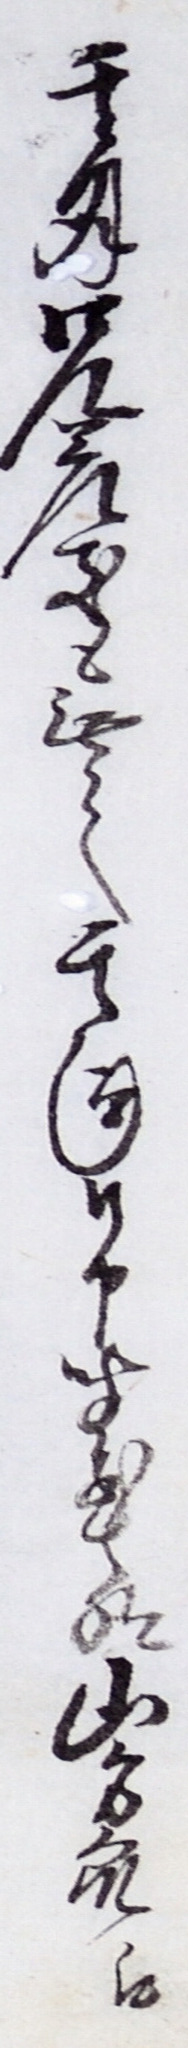其外先差支も無之其趣被申聞置候様山方衆江
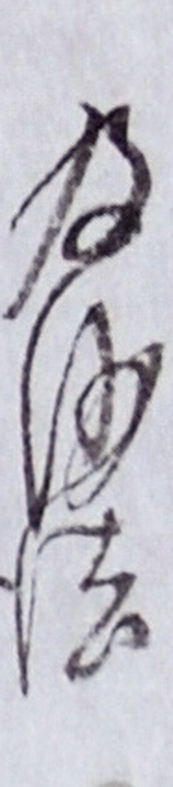及沙汰
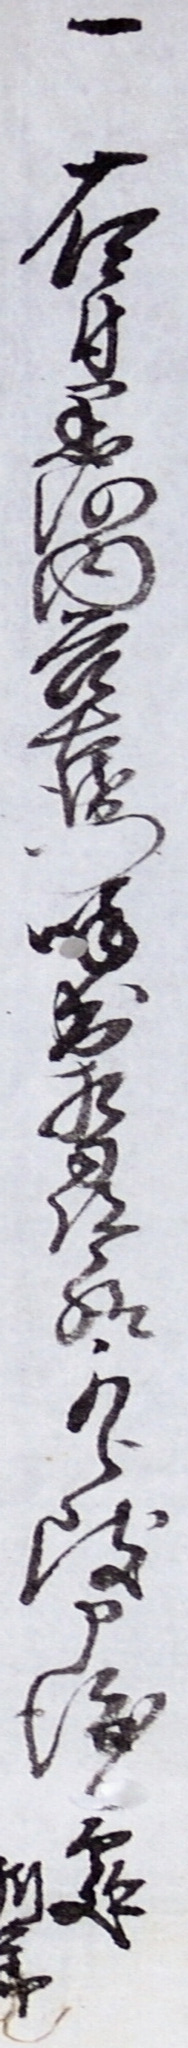一右ニ付黒河内善右衛門呼出相尋候様可致申渡候処
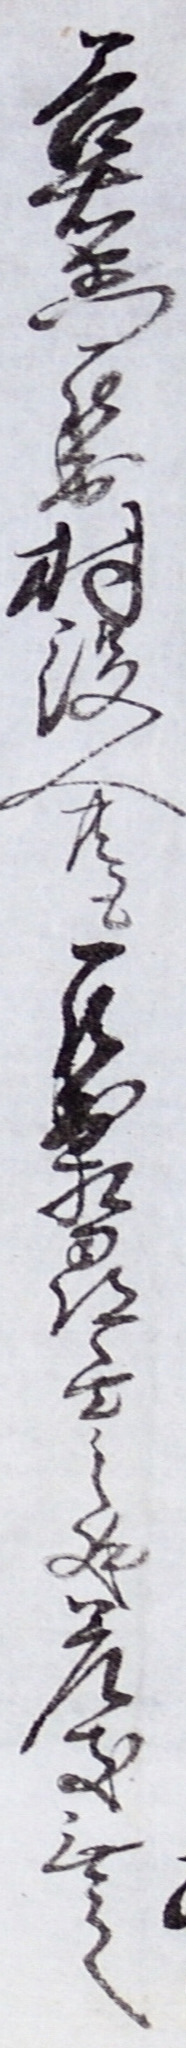善右衛門罷出村役人共も罷出相尋置候処差支無之
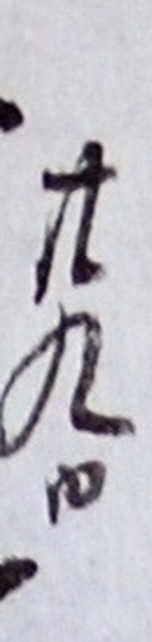廿九日
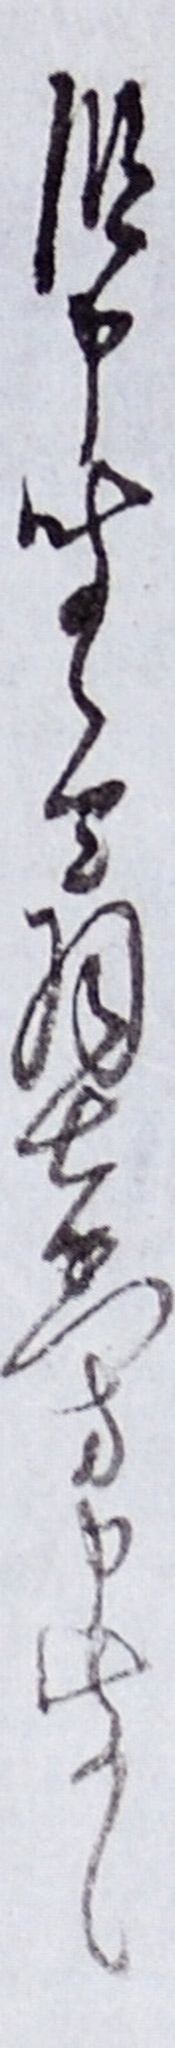様申聞候間羽右衛門方申聞候
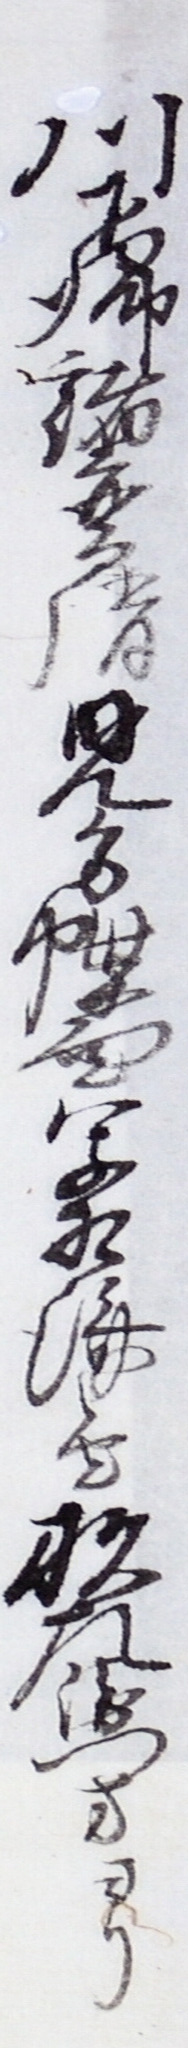一川下郷諸普請見分帳面写相済之由杉左衛門方ヨリ
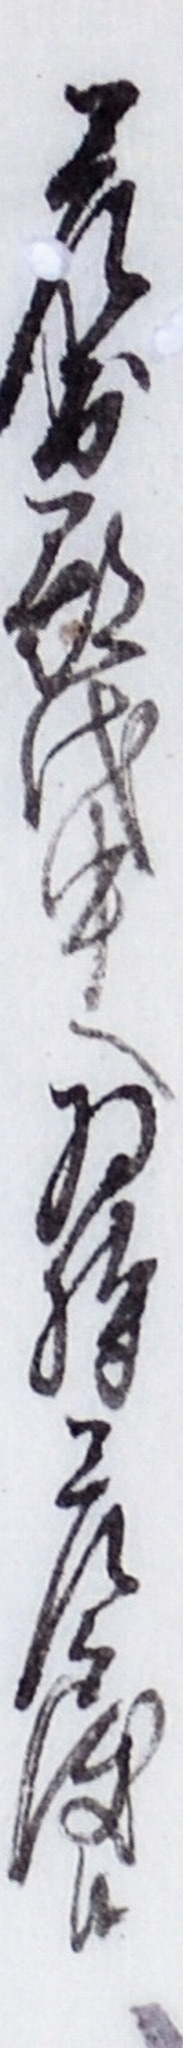差出郡代中へ為持差渡候
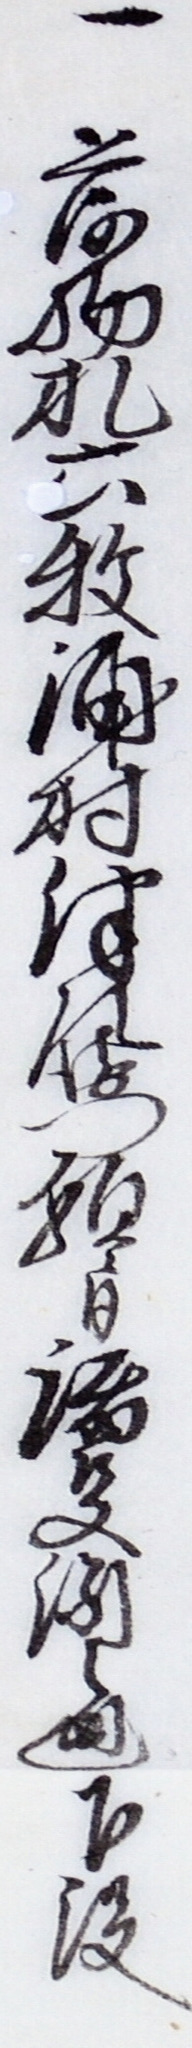一荷物札六枚浦村伴左衛門願ニ付諸是又例之通下役
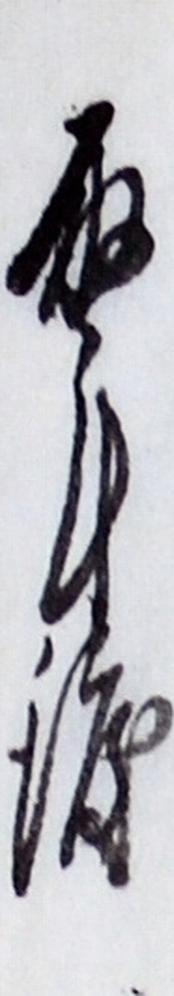取斗渡
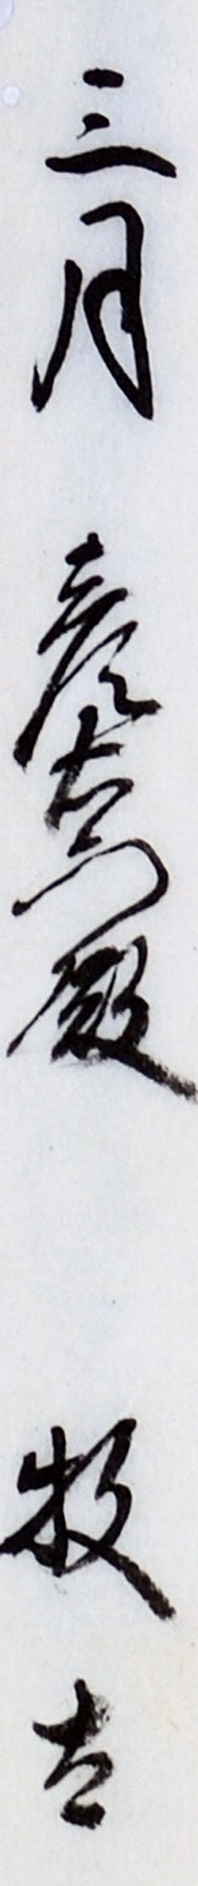三月彦右衛門殿牧田
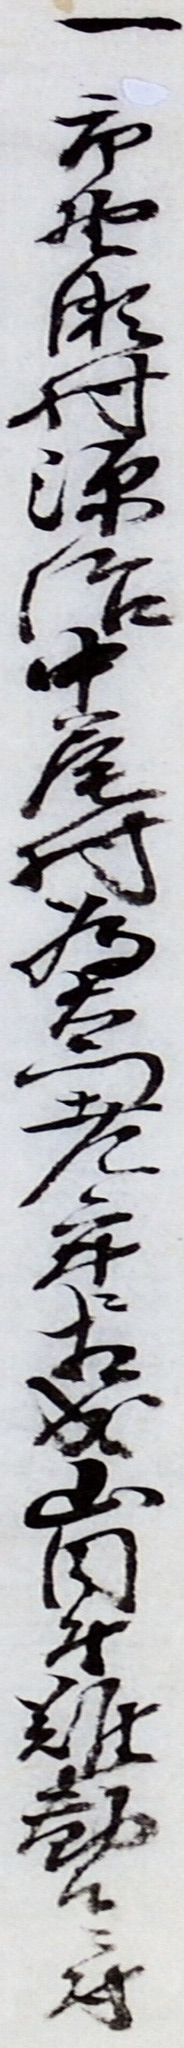一市野瀬村源治中尾村為右衛門老年ニ相成山目付難勤候ニ付
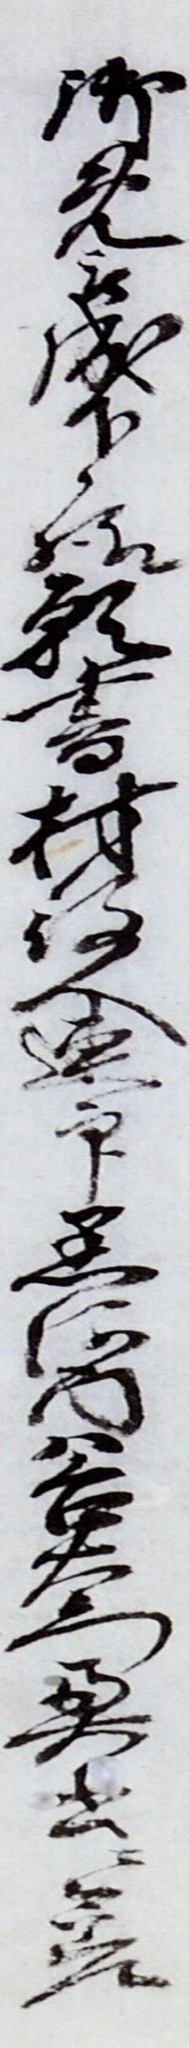御免被成下候様願書村役人連印黒河内善右衛門奥書ニ而差
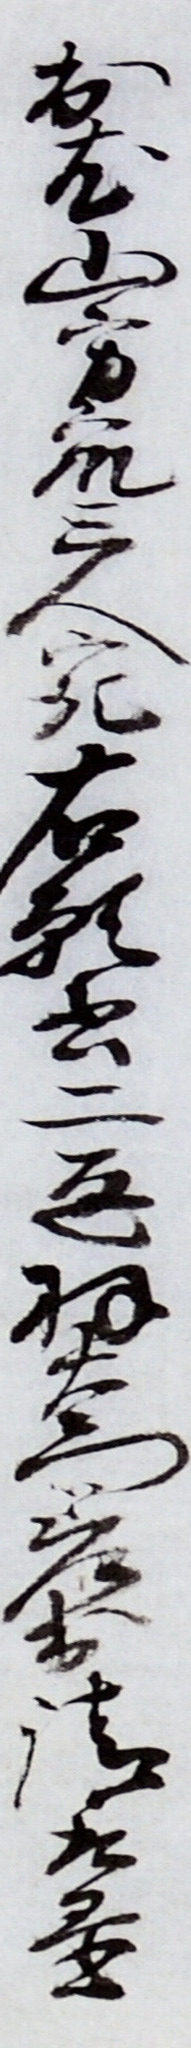出尤山方衆三人宛右願書二通羽右衛門差出請取置
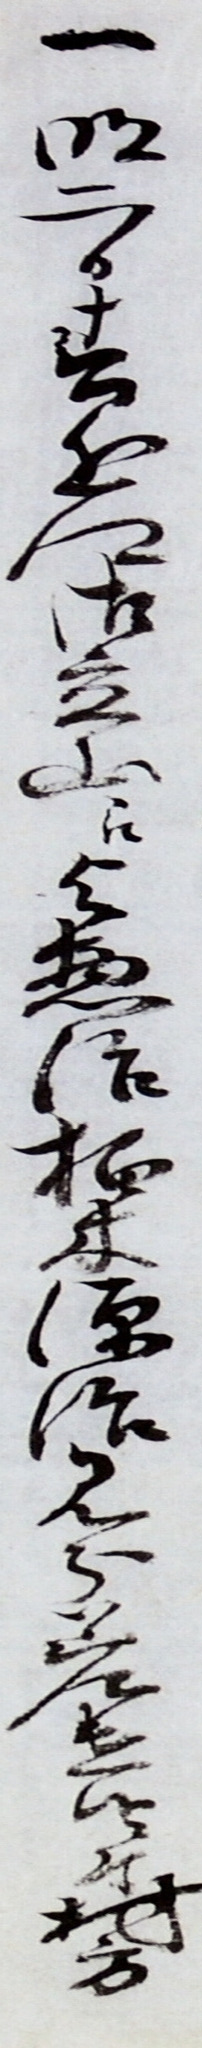一明二日春近郷御立山江与惣治柏木源治見分差遣候ニ付村方
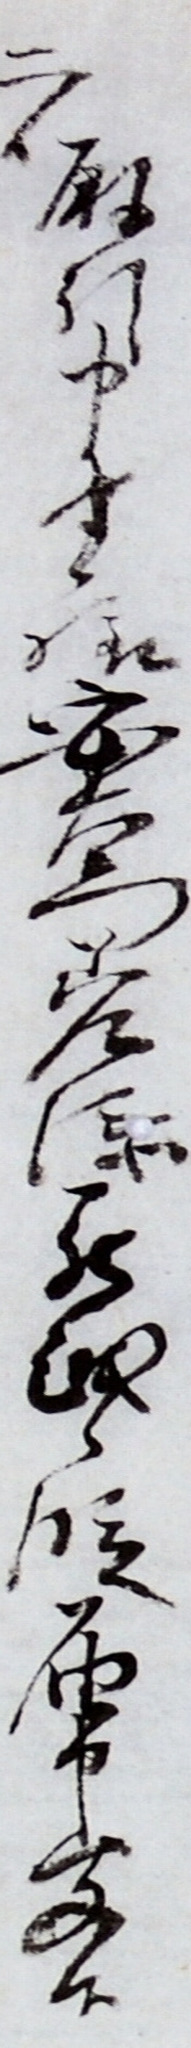取計申付候様安右衛門差添罷越候段届申聞候
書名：御山奉行御用控
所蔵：伊那市立高遠町図書館・合同会社AMANE
